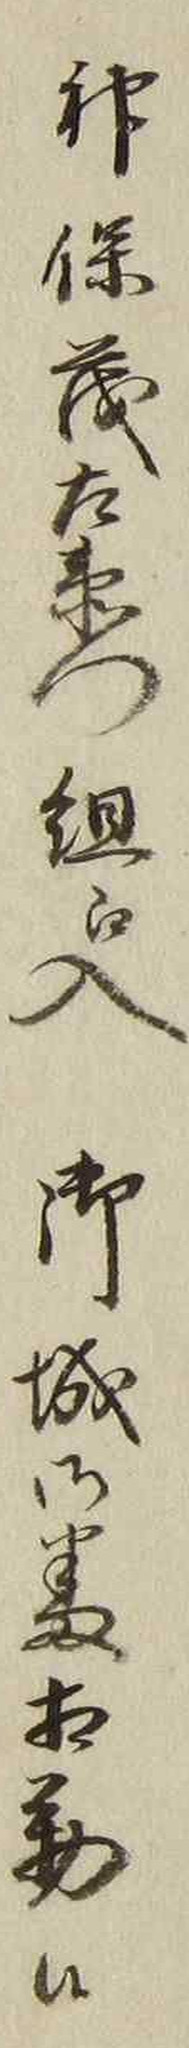神保茂左衛門組江入御城御番相勤候
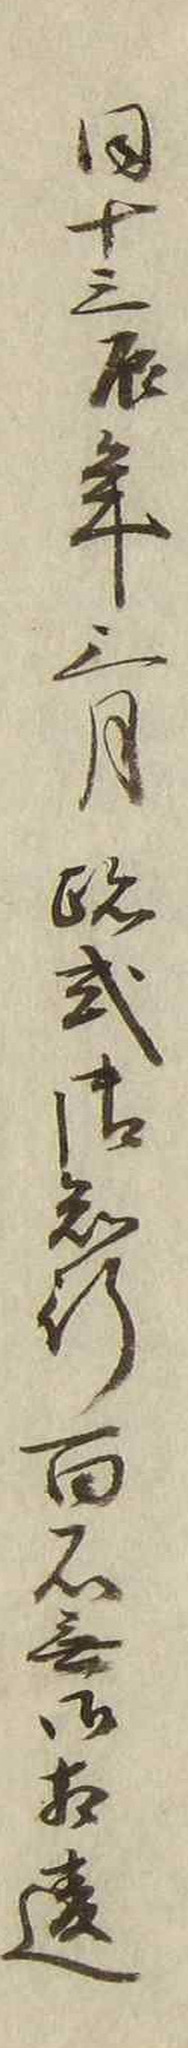一同十三辰三月跡式御知行百石無御相違

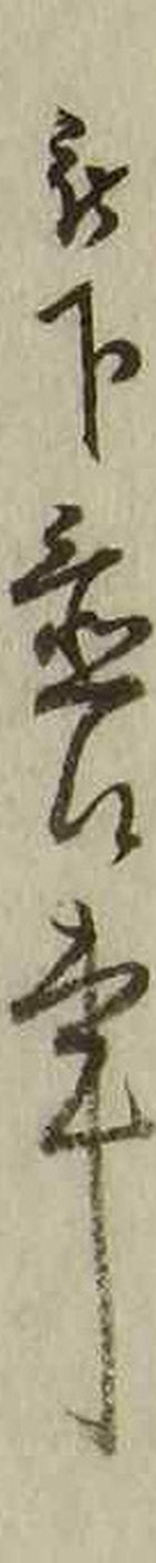被下置候事
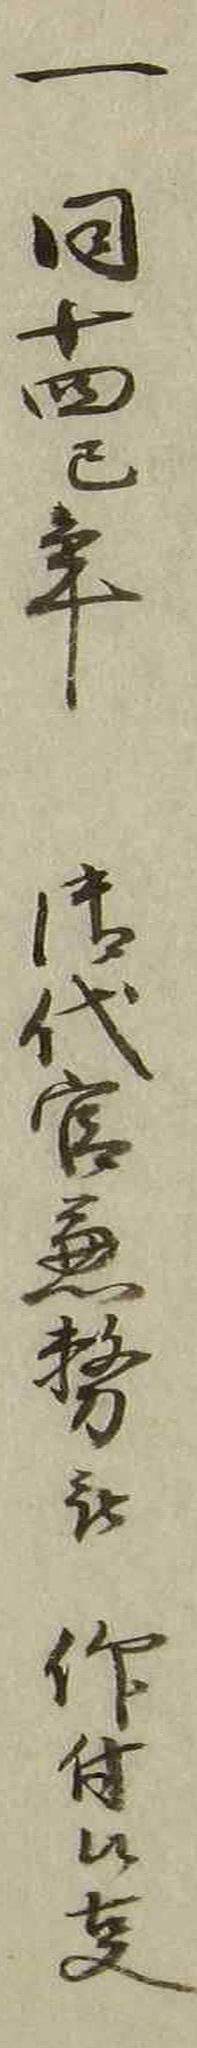一同十四巳年御代官兼務被仰付候事
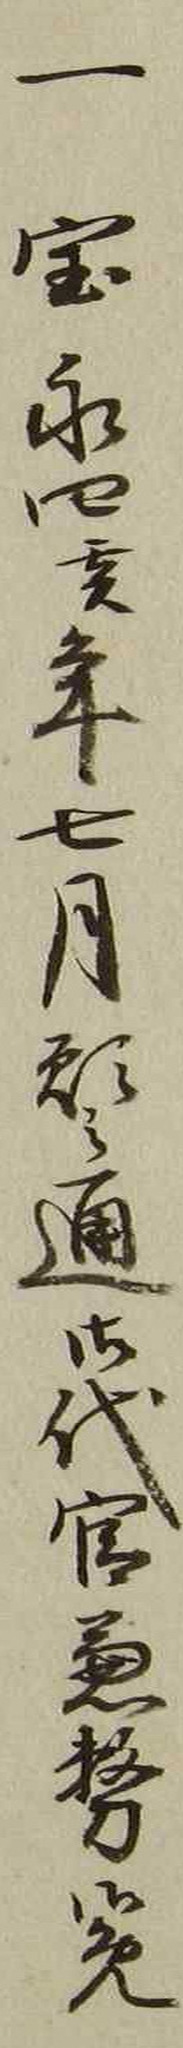一宝永四亥年七月願之通御代官兼務御免
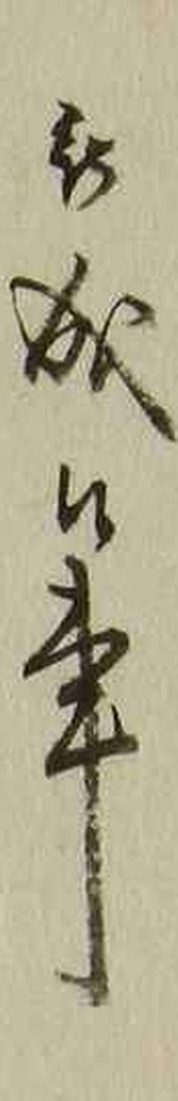被成候事
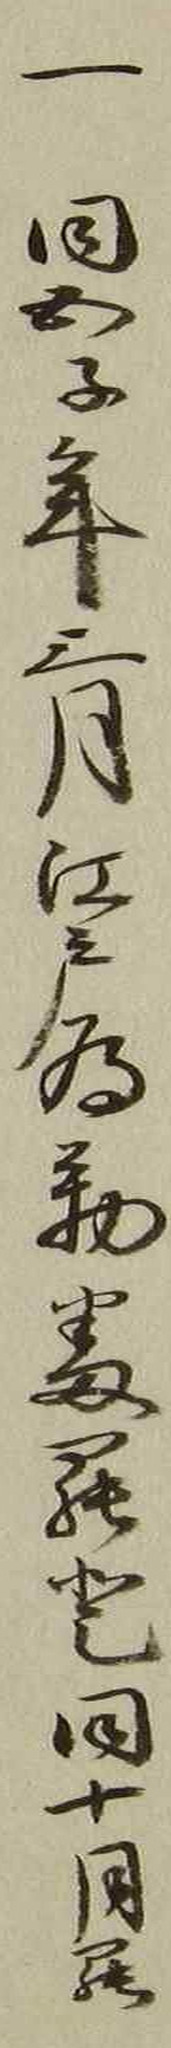一同五子年三月江戸為勤番罷登同十月罷
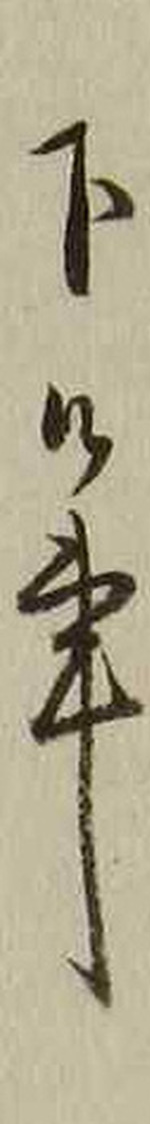下候事
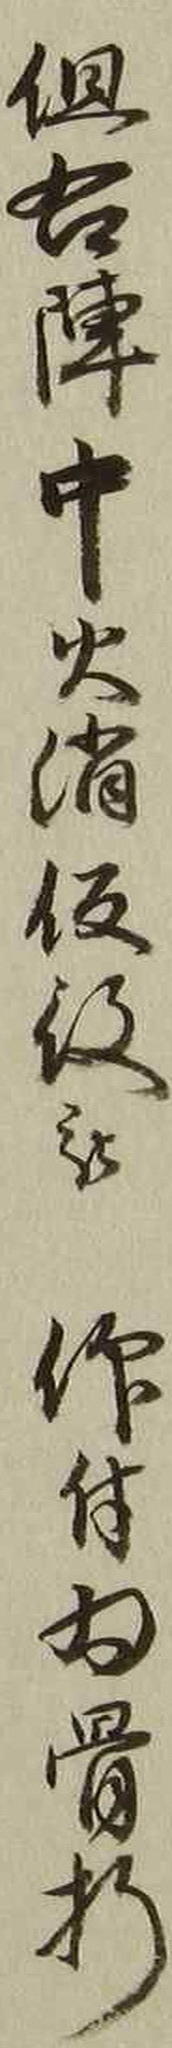但右陣中火消仮役被仰付為骨折
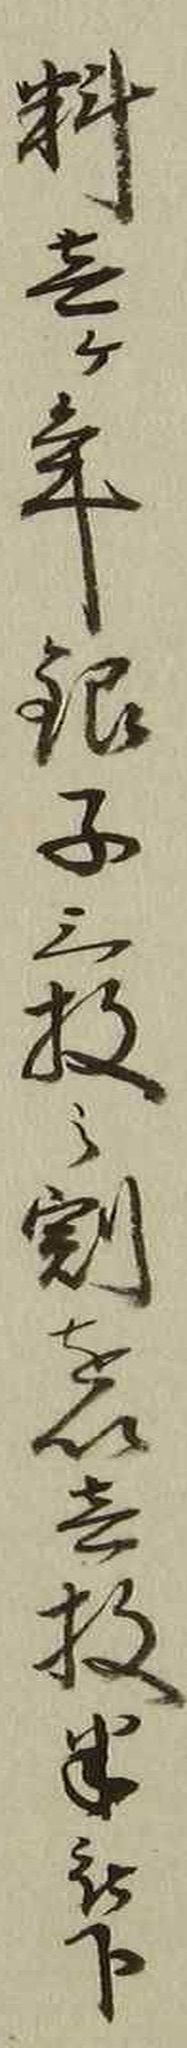料壱ヶ年銀子三枚之割を以壱枚半被下
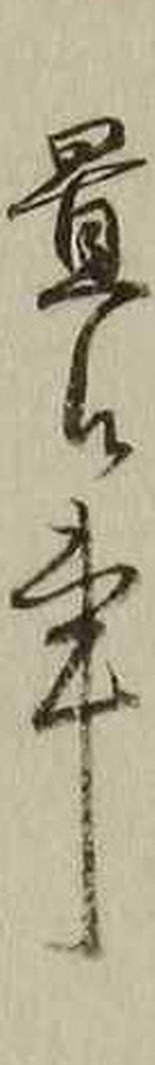置候事
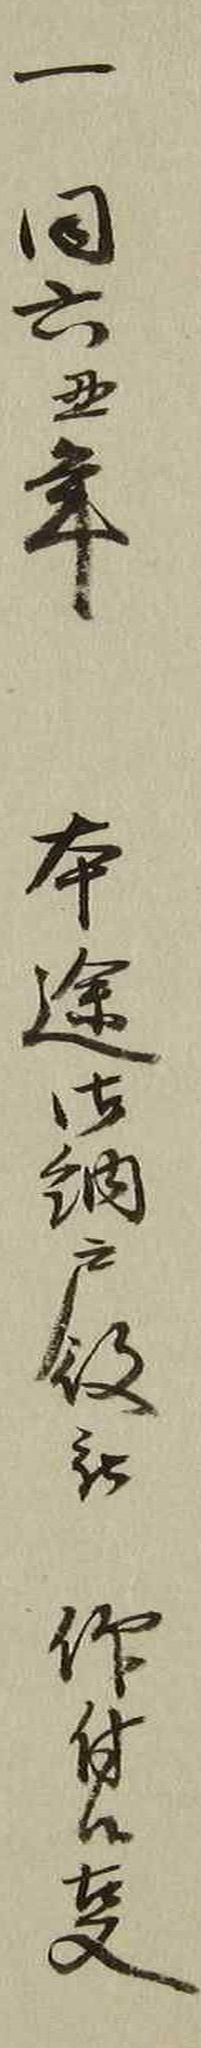一同六丑年本途御納戸役被仰付候事
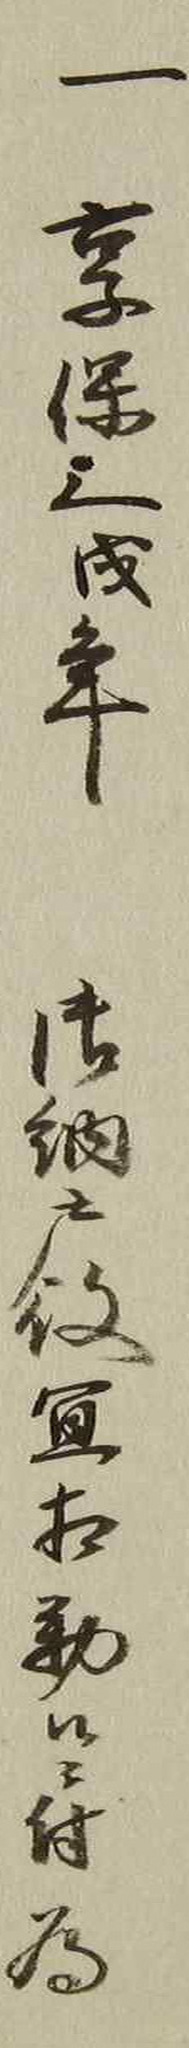一享保三戌年御納戸役宜相勤候ニ付為
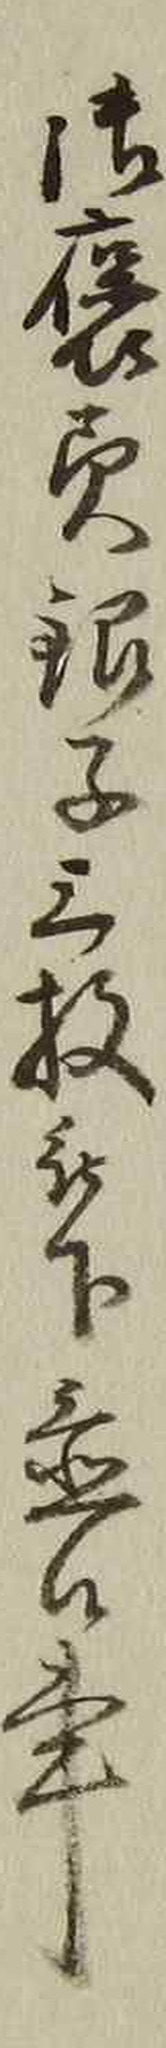御褒美銀子三枚被下置候事
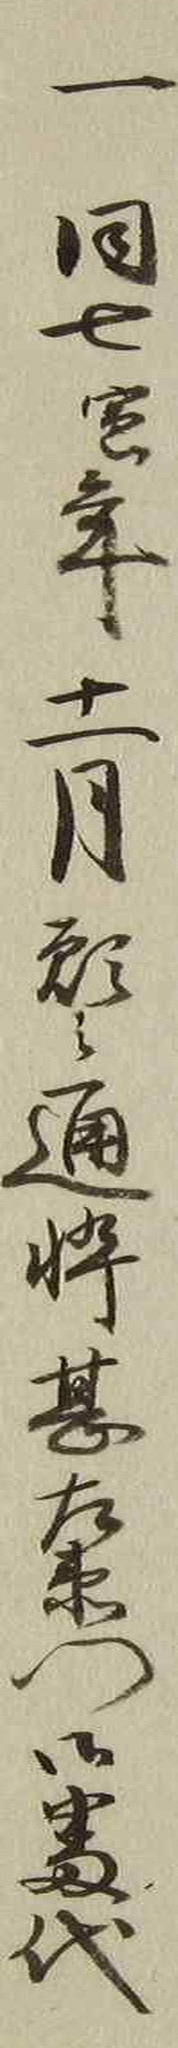一同七寅年十一月願之通忰甚左衛門御番代
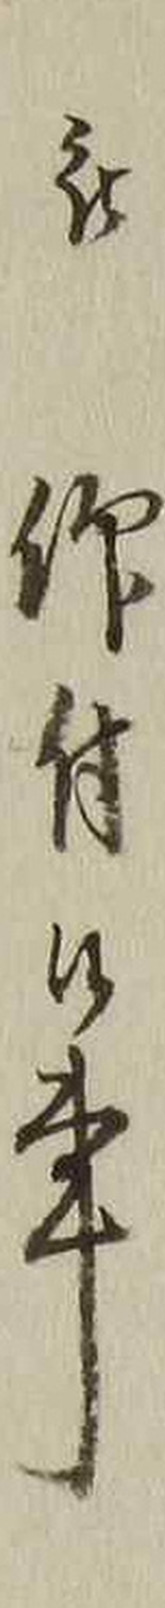被仰付候事
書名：諸士系譜　巻之128　た之部4
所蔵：会津若松市立会津図書館
